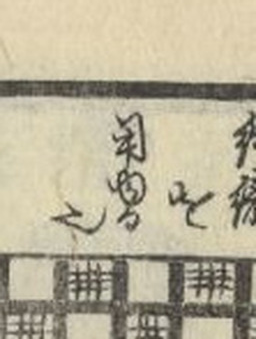用ゆる
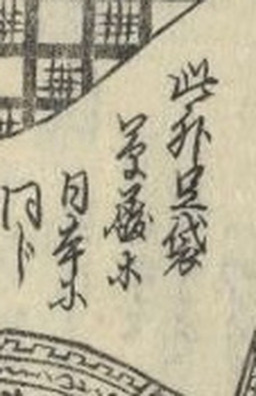草履等
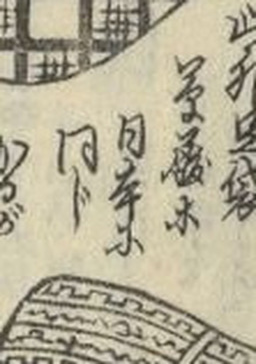日本に
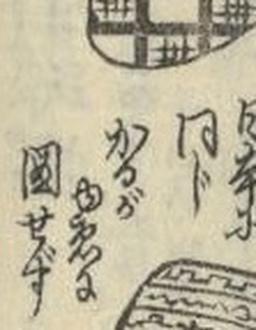かるが
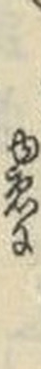ゆゑに
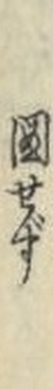図せず
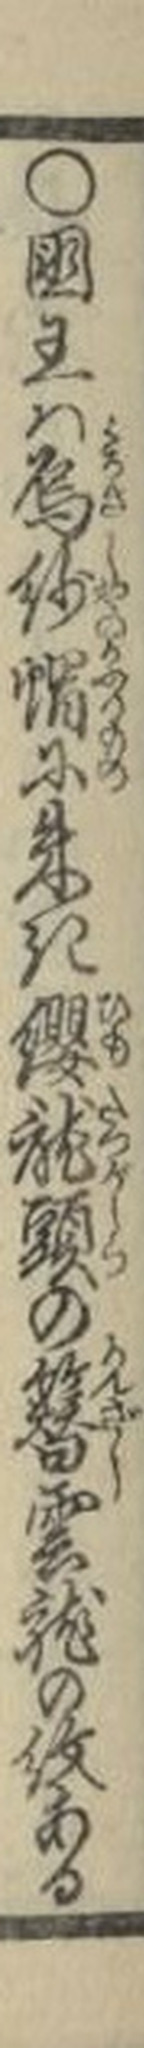○国王は烏紗帽に朱き纓龍頭の簪雲龍の紋ある
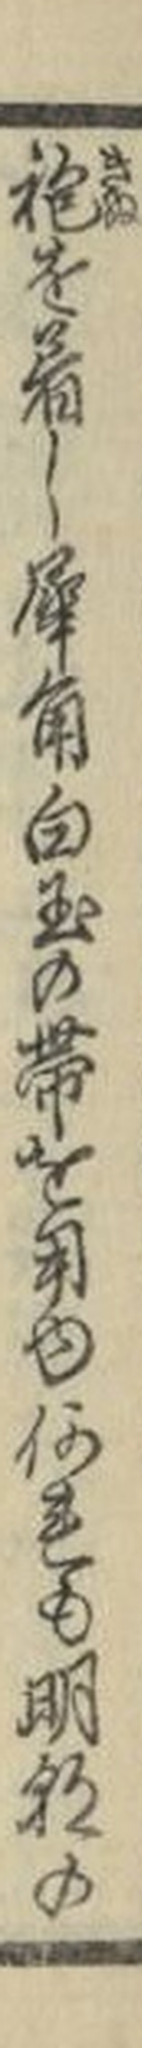袍を着し犀角白玉の帯を用ゆ何れも明朝の
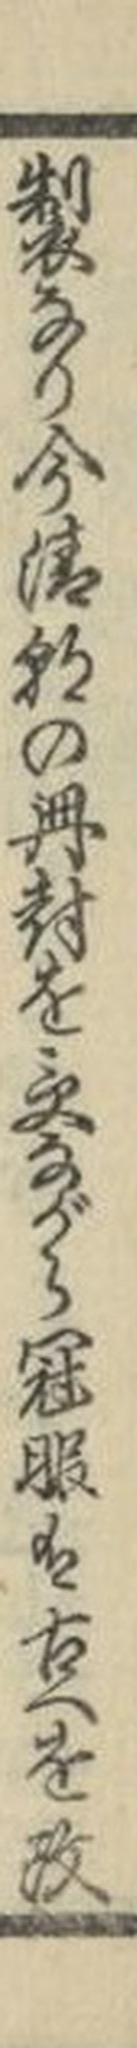製なり今清朝の冊封を受ながら冠服は古へを改
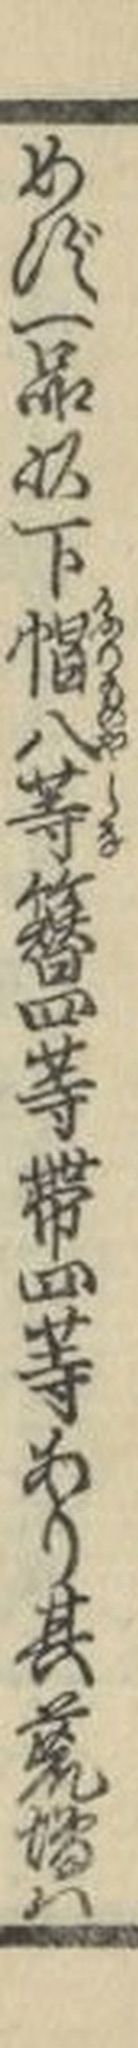めず一品以下帽八等簪四等帯四等あり其荒増は
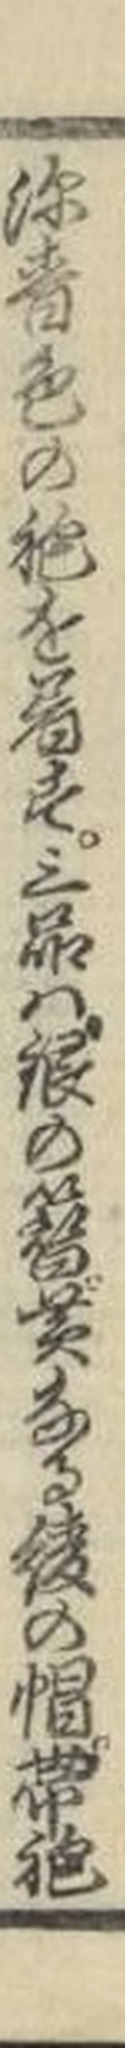深青色の袍を着す。三品は銀の簪。黄なる綾の帽。帯袍
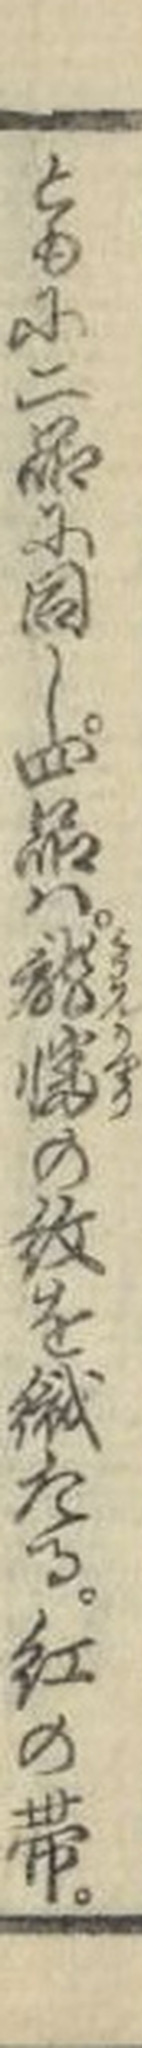ともに二品に同し。四品は。龍蟠の紋を織たる。紅の帯。
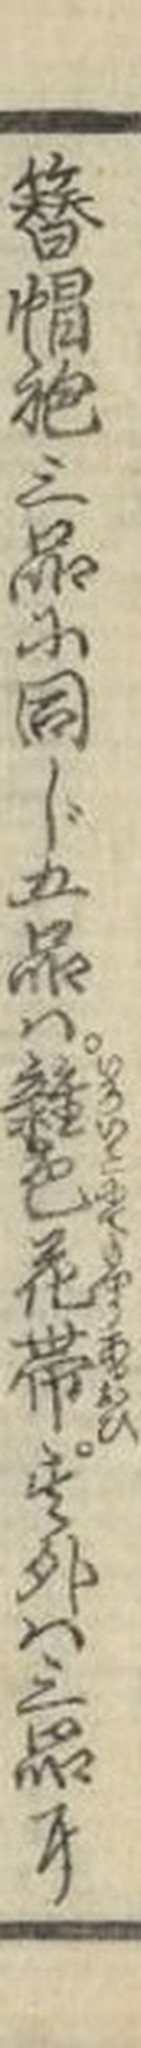簪帽袍三品に同じ五品は。絲色花帯。其外は三品に
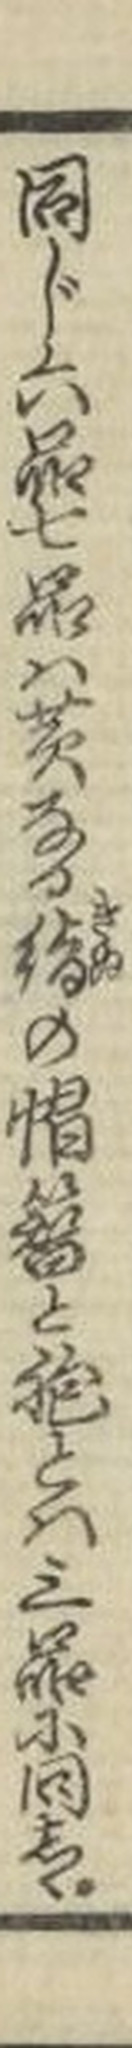同じ六品七品は黄なる絹の帽簪と袍とは三品に同しく。
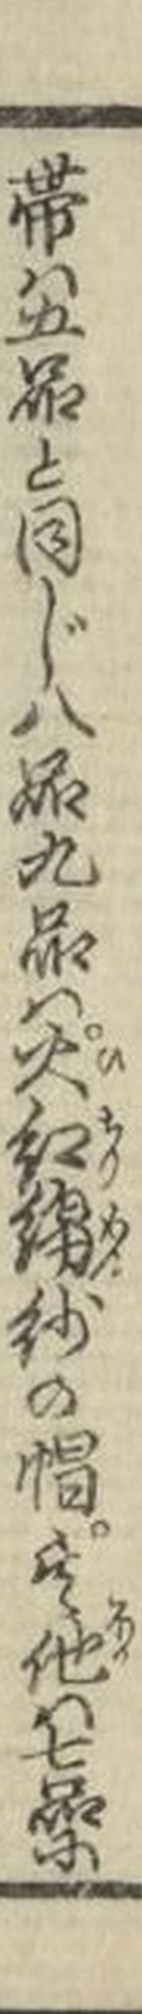帯は五品と同じ八品九品は。火紅絹紗の帽。其他は七品に
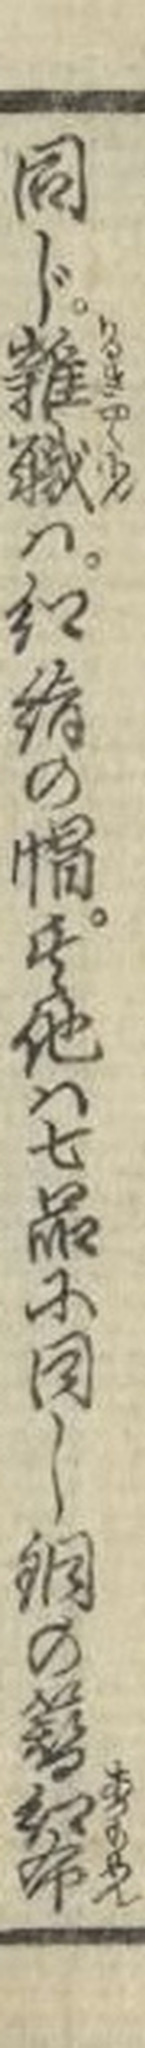同じ。雑職は。紅絹の帽。其他は七品に同し銅の簪紅布
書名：琉球解語
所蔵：University of the Ryukyus Library
